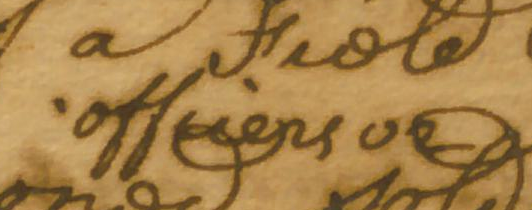officers or
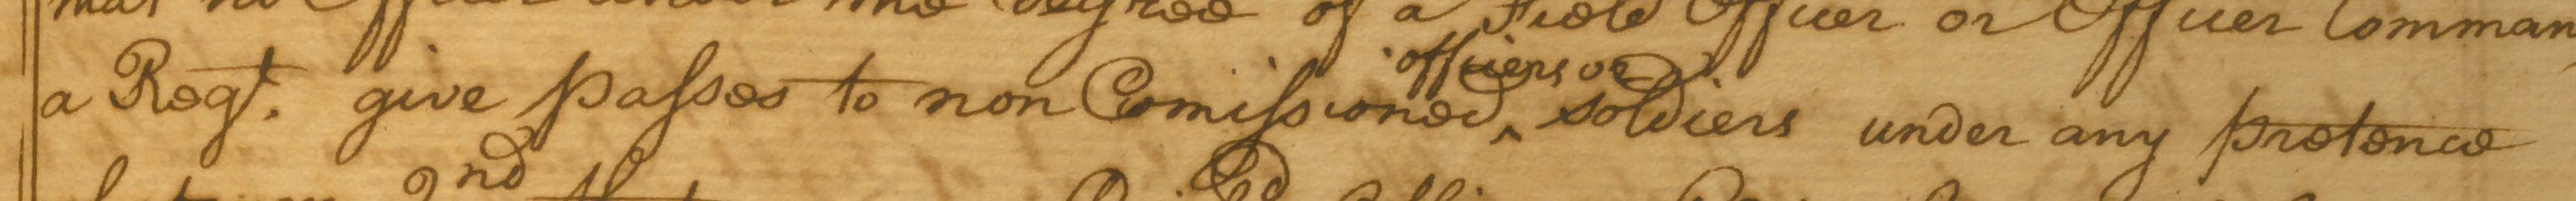a Reg^t. give passes to non Comissioned ^ soldiers under any pretence
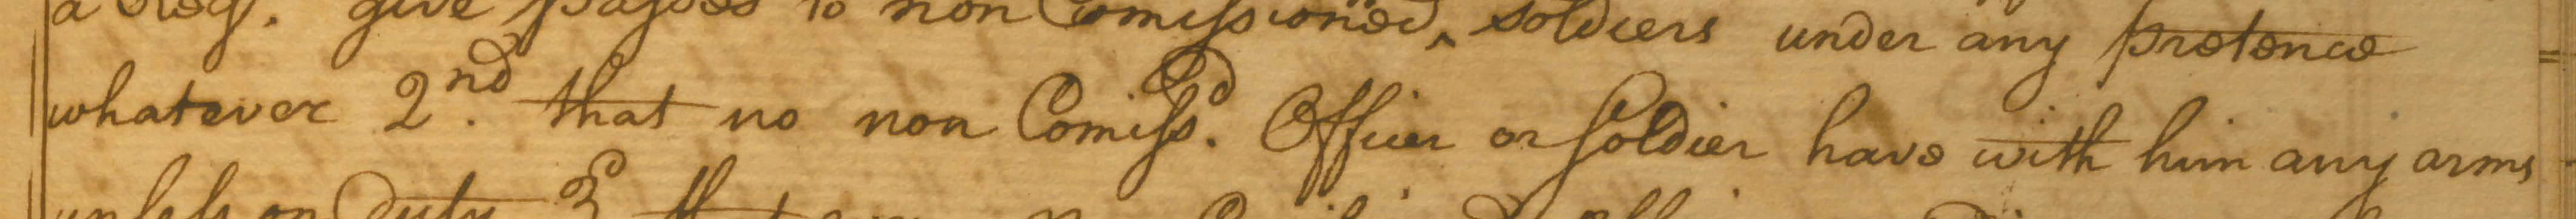whatever 2^nd. that no non Comiss^d. Officer or Soldier have with him any arms
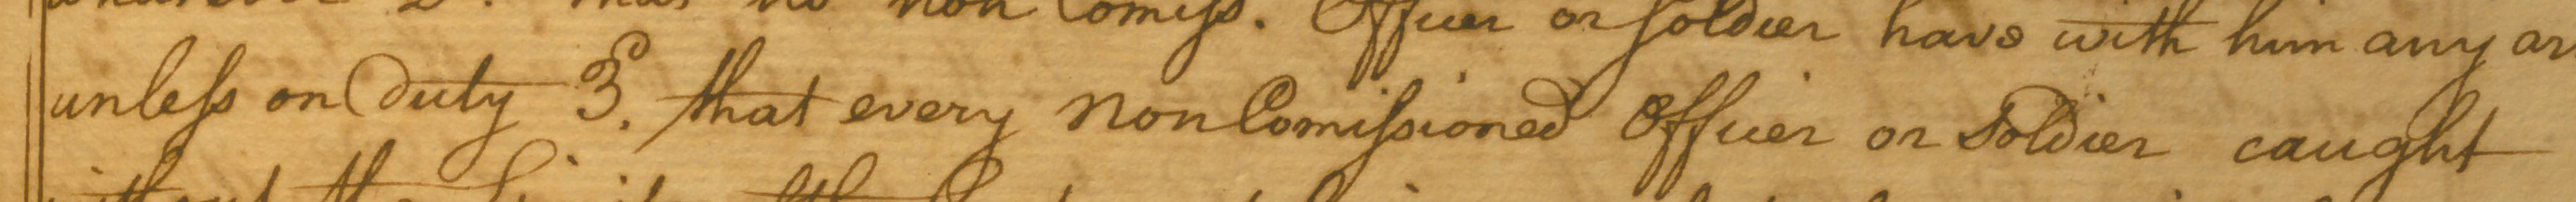unless on duty 3^d. that every non Comissioned Officer or Soldier caught
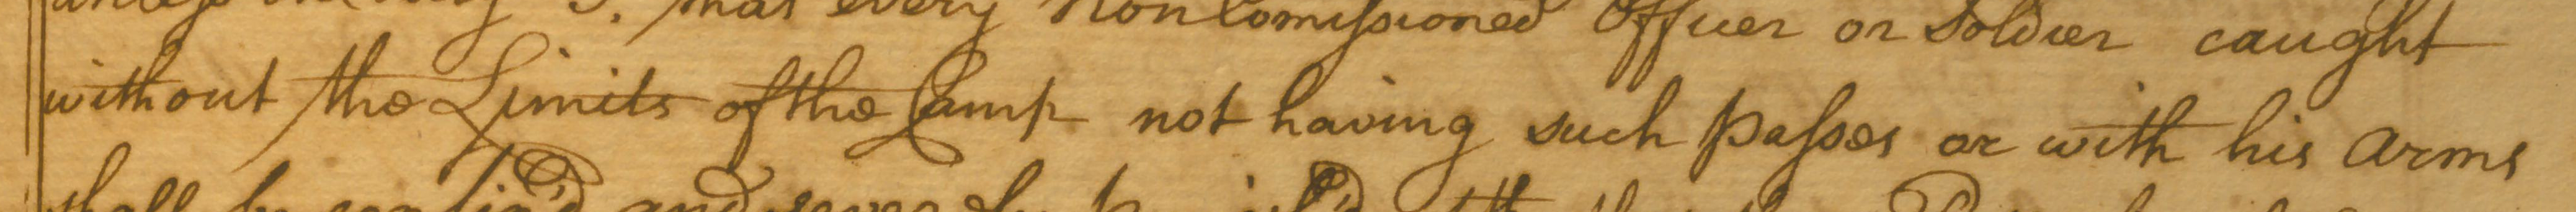without the Limits of the Camp not having such passes or with his Arms
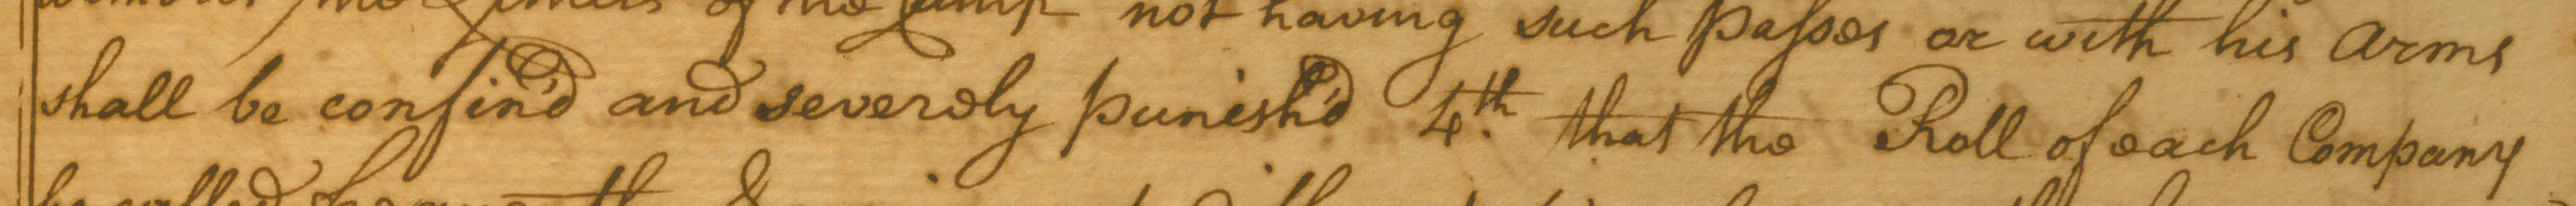shall be confin'd and severely punish'd 4^th. that the Roll of each Company
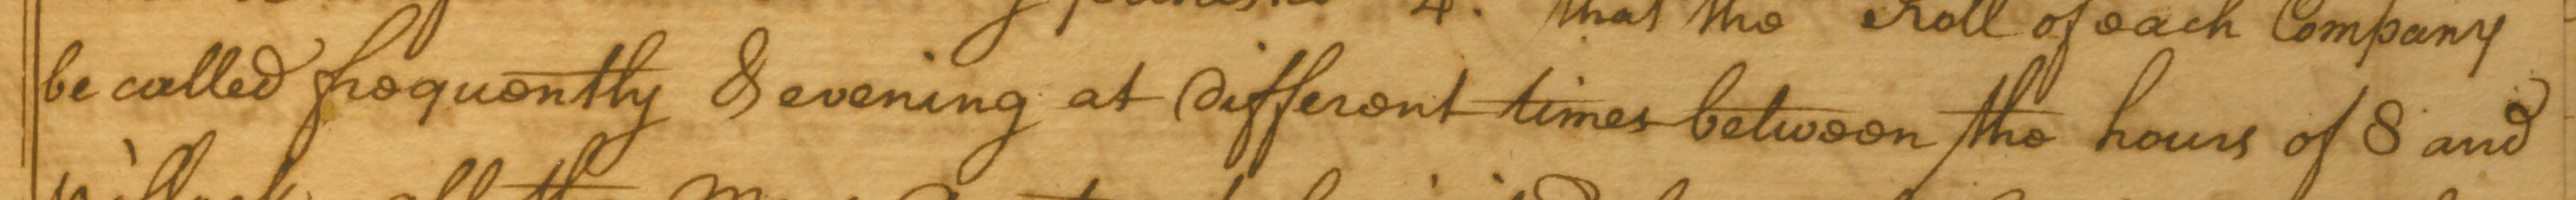be called frequently & evening at different times between the hours of 8 and
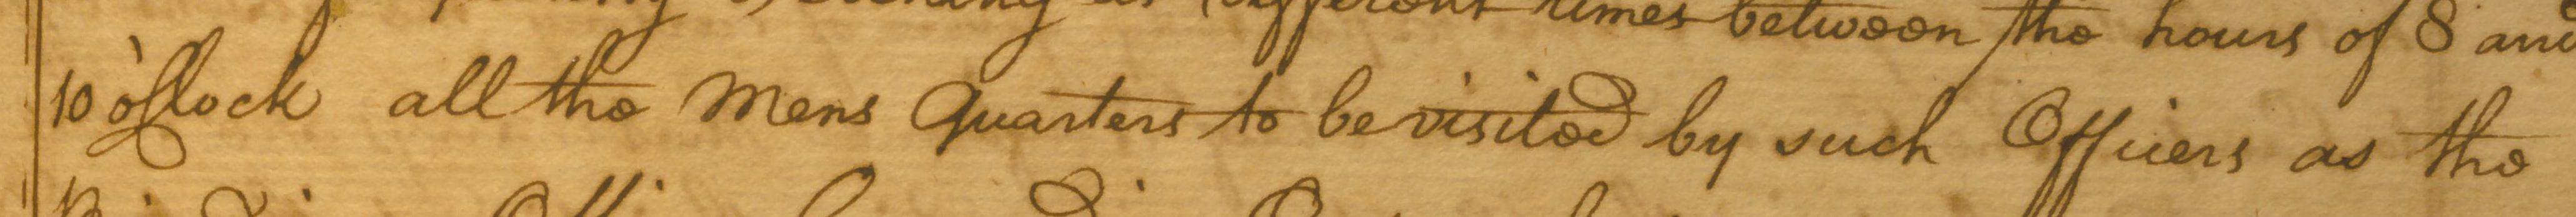10 o'Clock all the mens quarters to be visited by such Officers as the
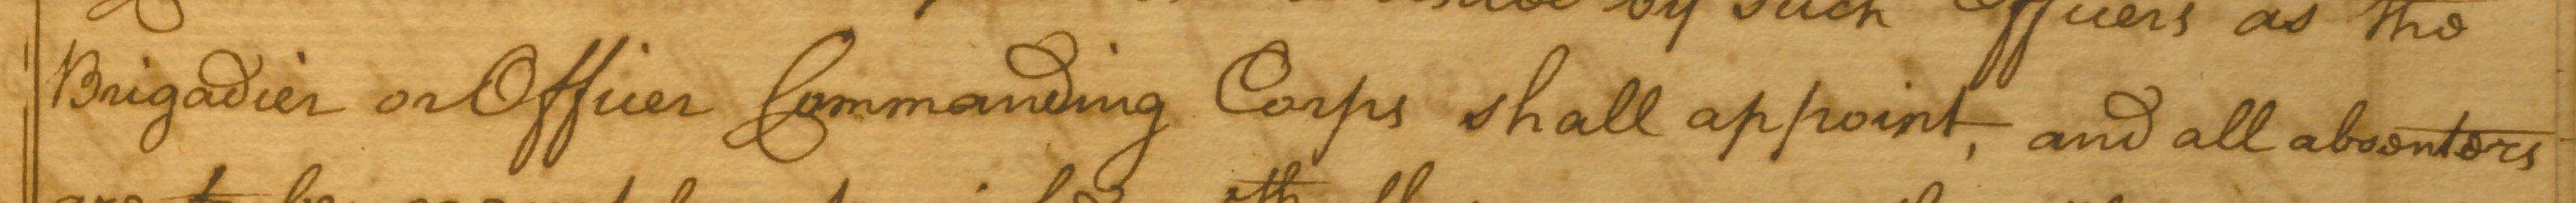Brigadier or Officer Commanding Corps shall appoint, and all absentors
